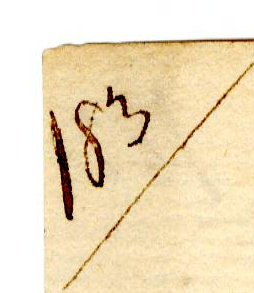183
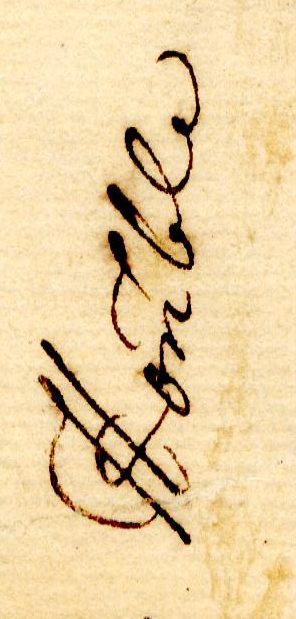Hon^rble
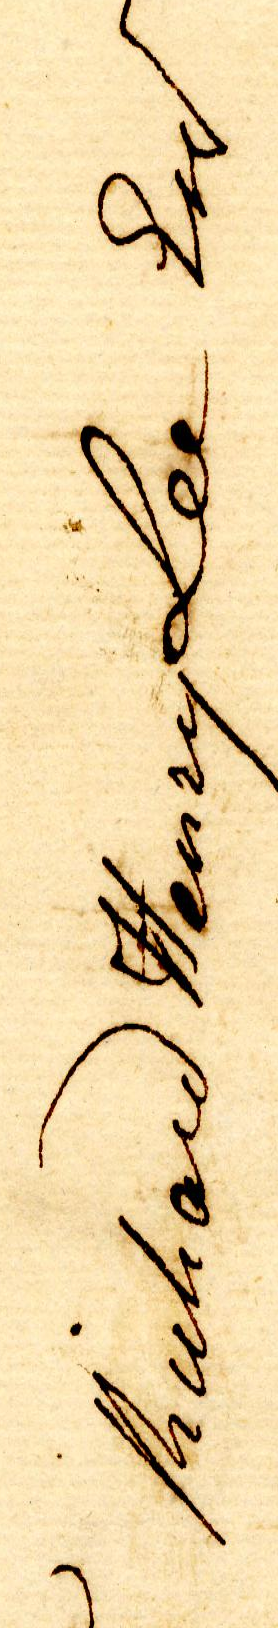Richard Henry Lee Esq^r
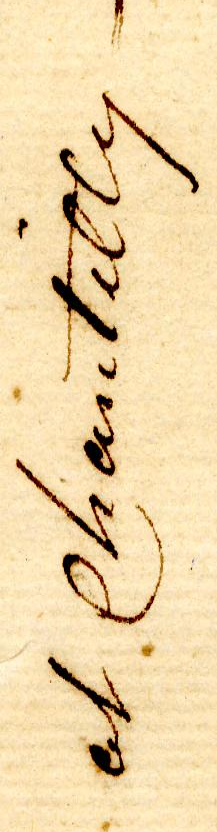at Chantilly
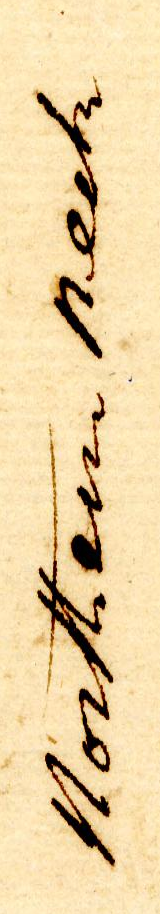Northern neck
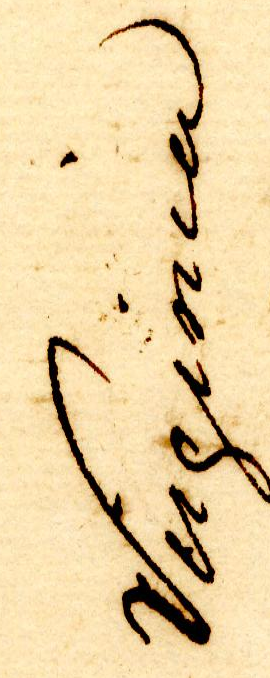Virginia
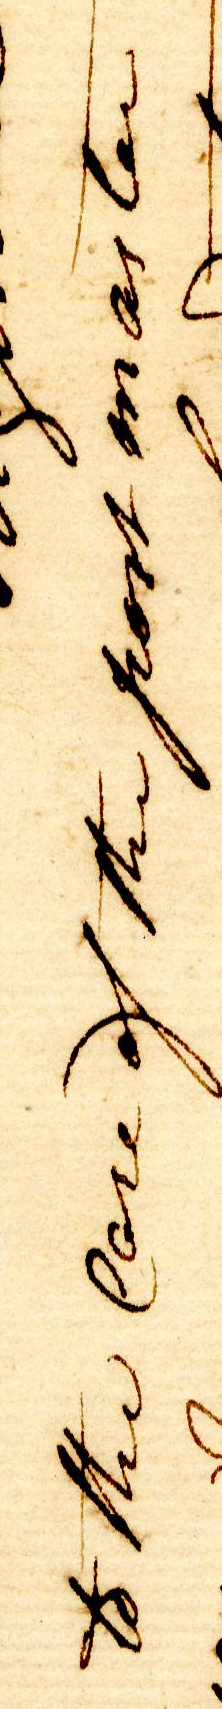to the care of the post master
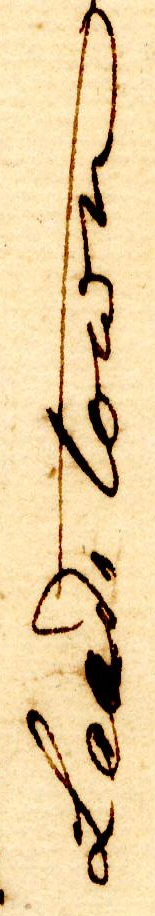Leeds town
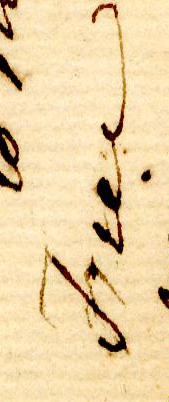Free
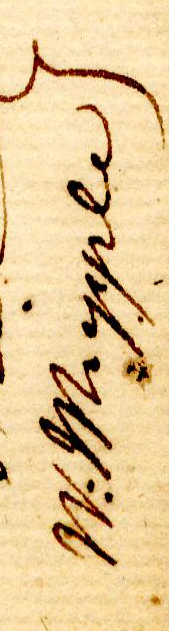W: Whipple
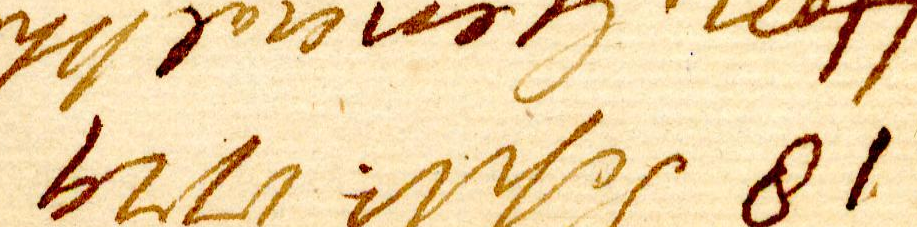18 Sept^r. 1779
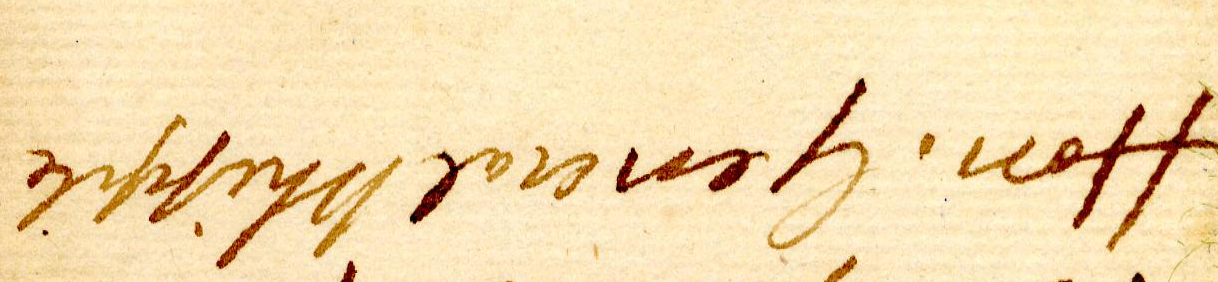Hon. General Whipple
